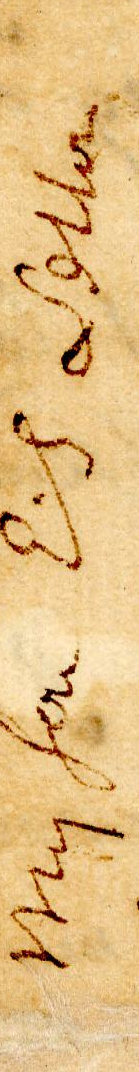my son E.S Letter
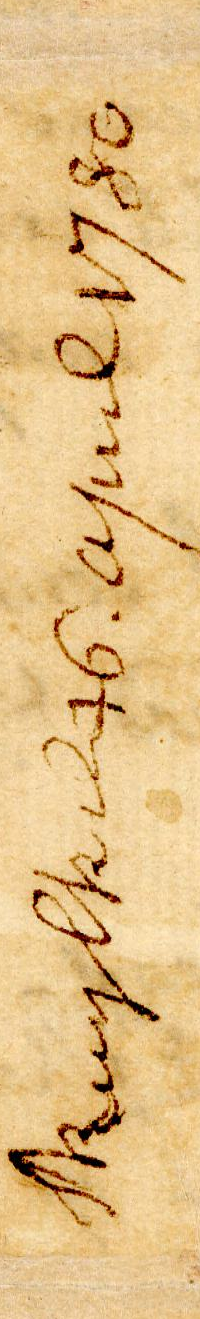Skuylkil 16. April 1780
